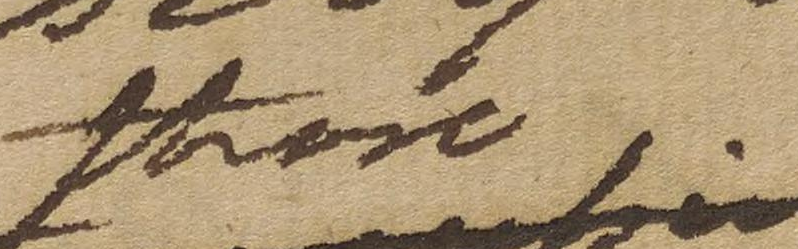those
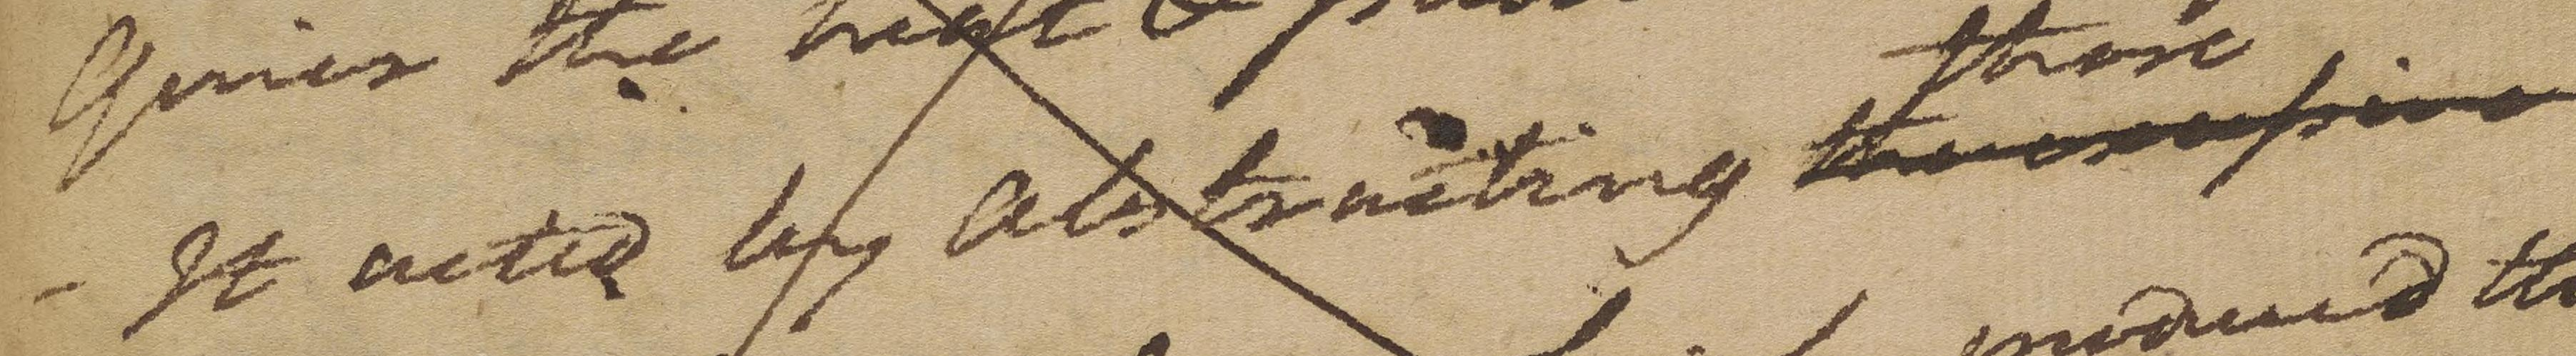It acted by abstracting [the excessive]
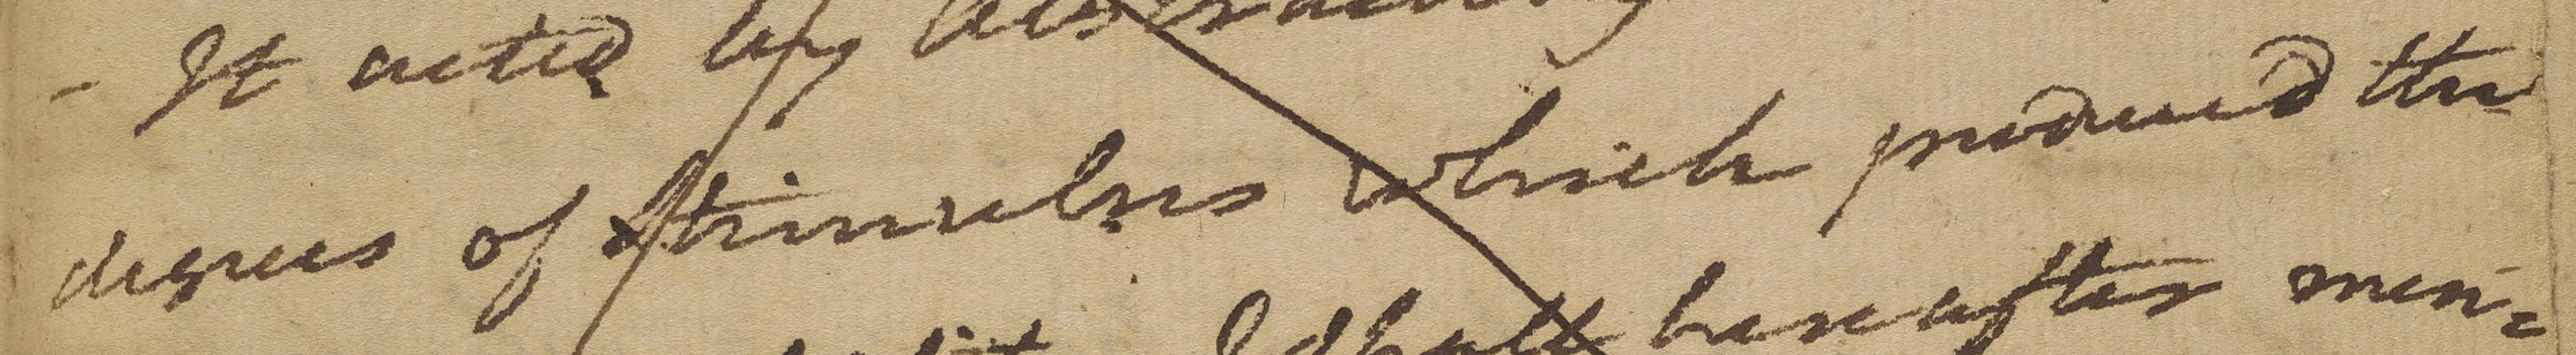degrees of stimulus which produced the
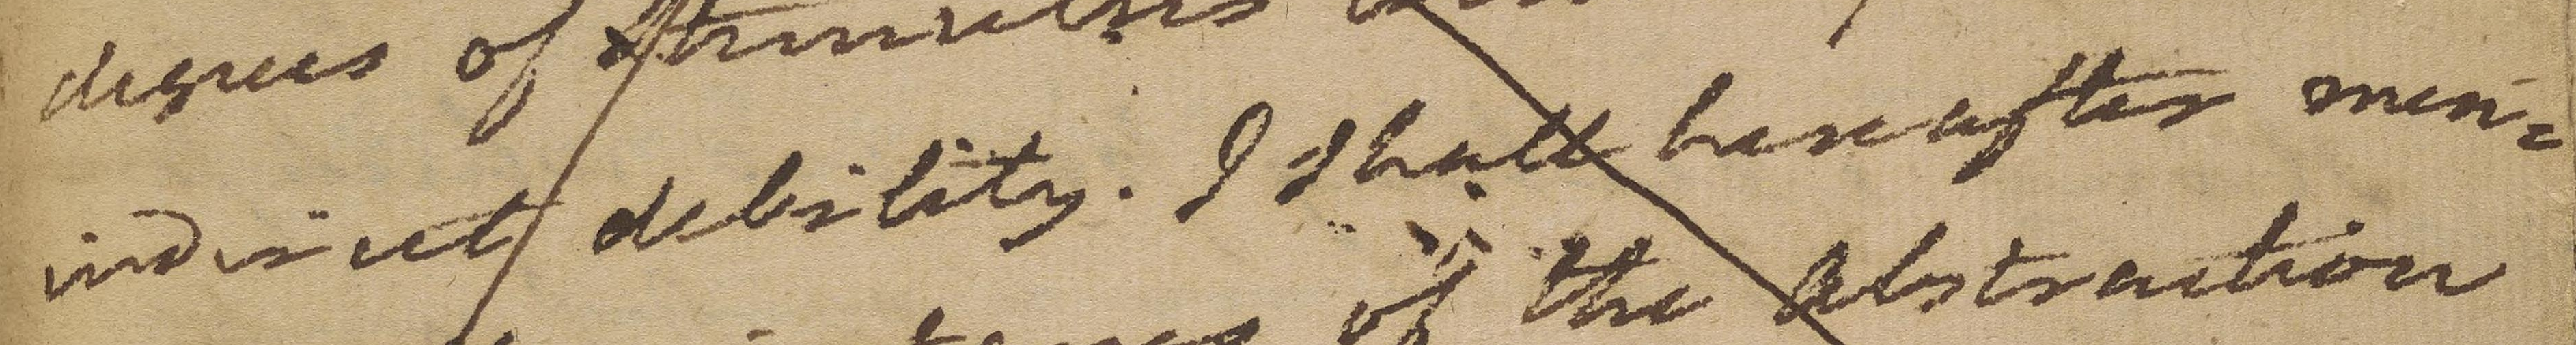indirect debility. I shall hereafter men-
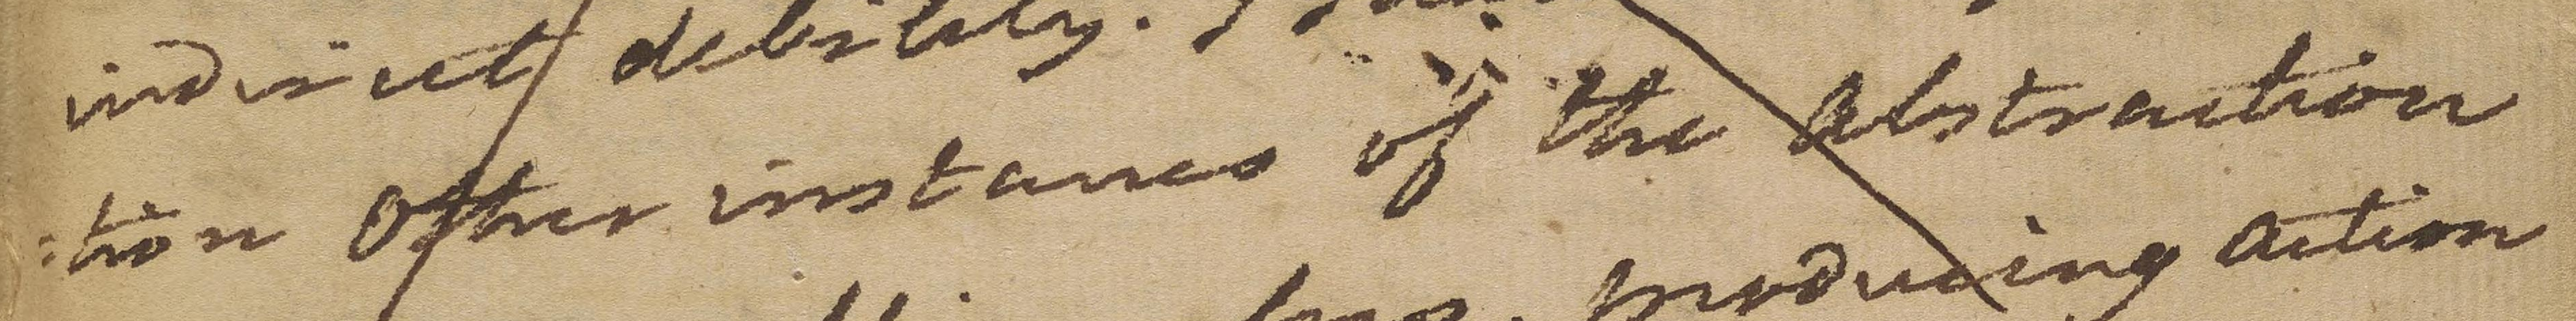-tion other instances of the abstraction
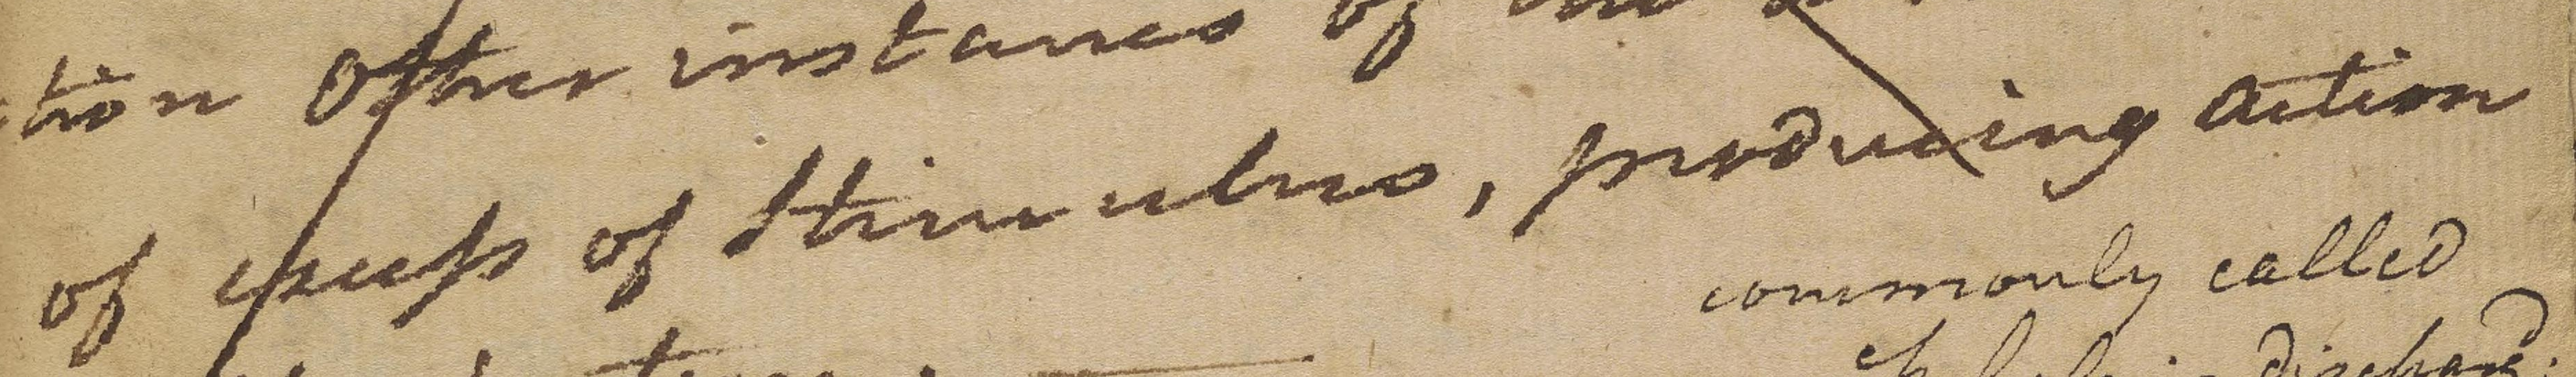of excess of stimulus, producing action
